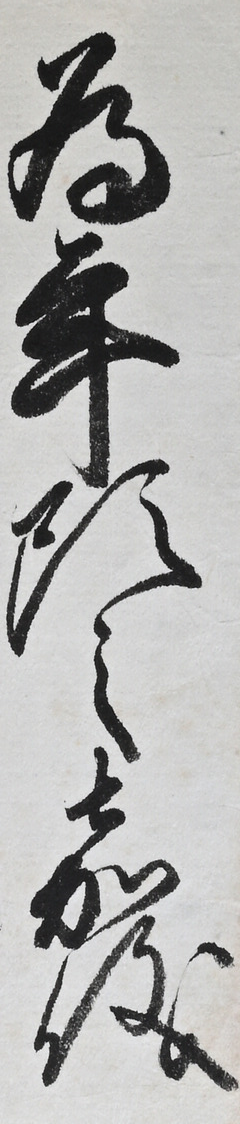為年頭之嘉儀
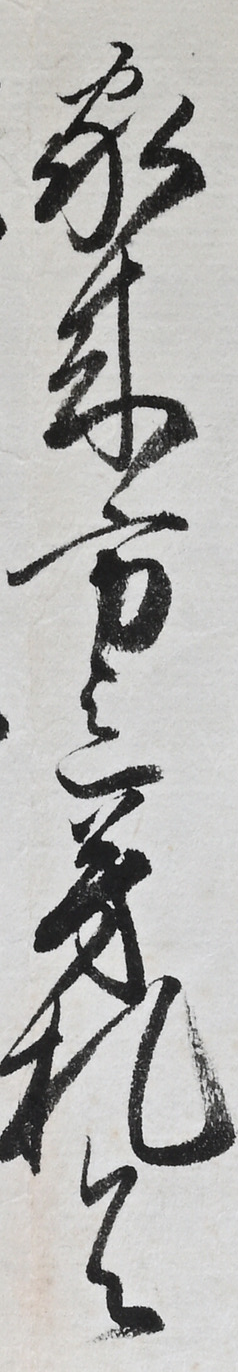家来方迄芳札令
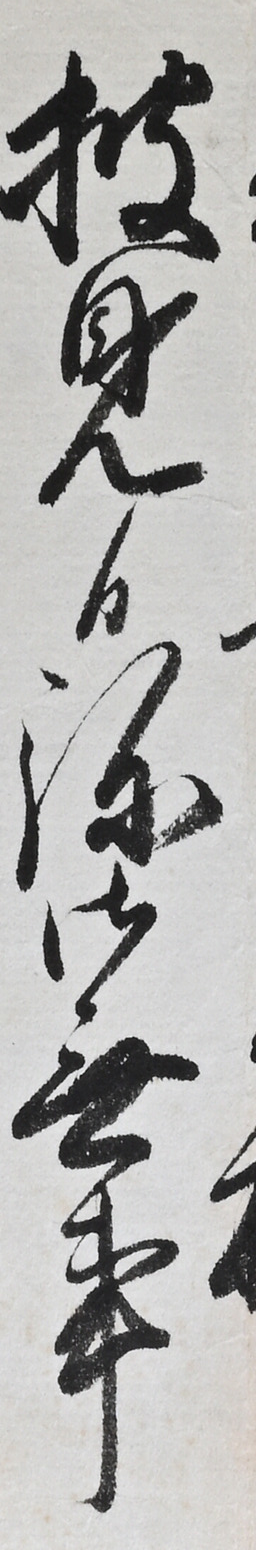披見候弥御無事
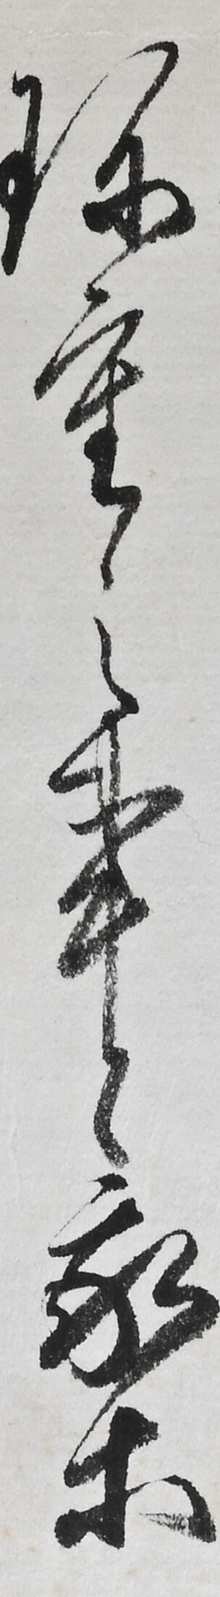珍重之事と我等
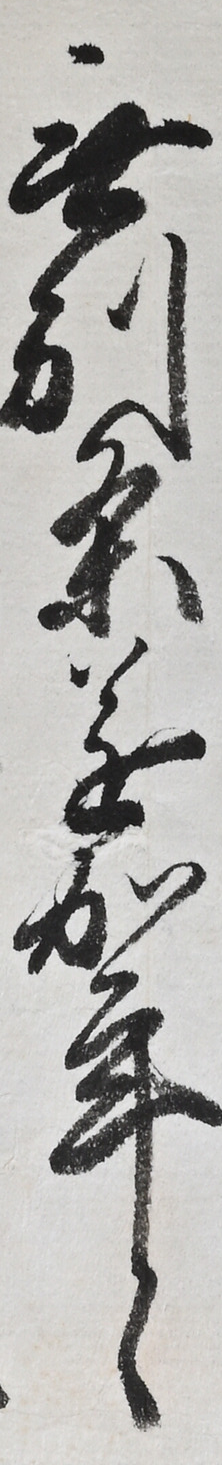無別条遂加年之
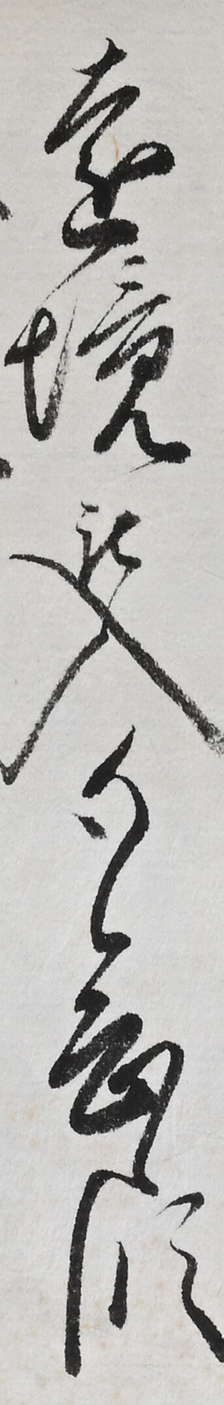遠境被入御念候段
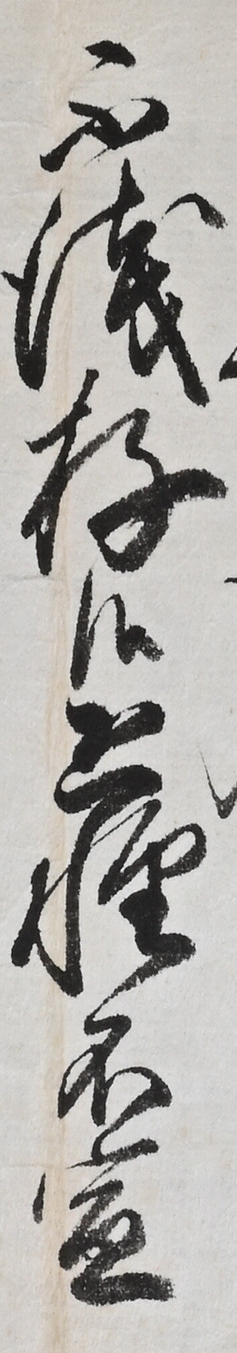不浅存候恐惶不宣

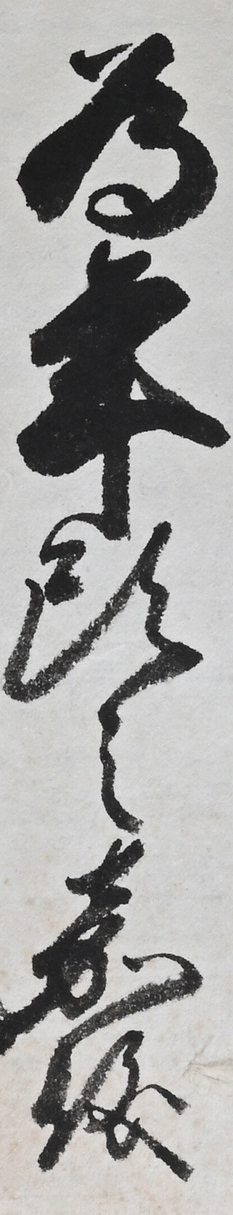為年頭之嘉儀
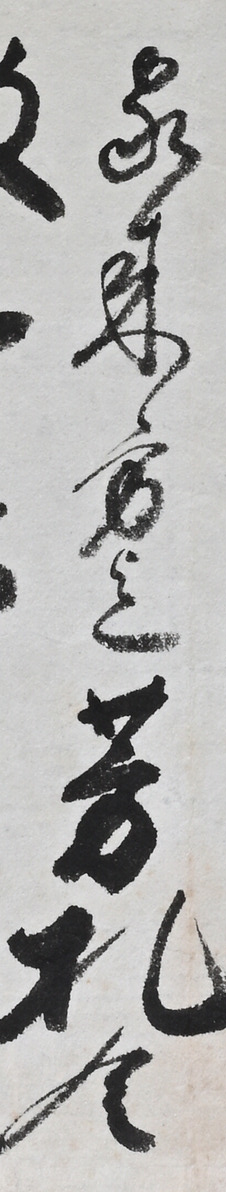家来方迄芳札令
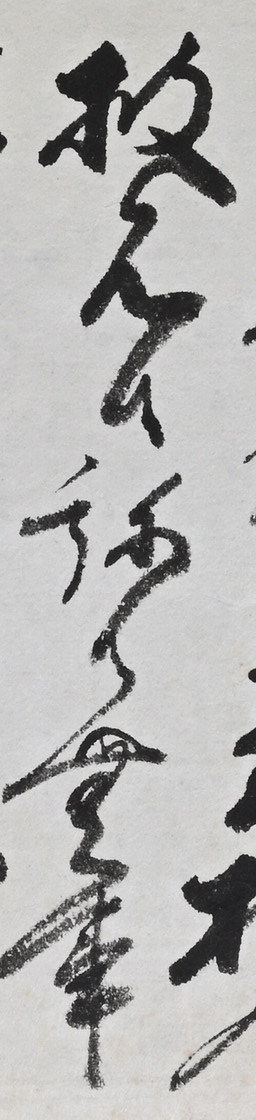披見候弥御無事
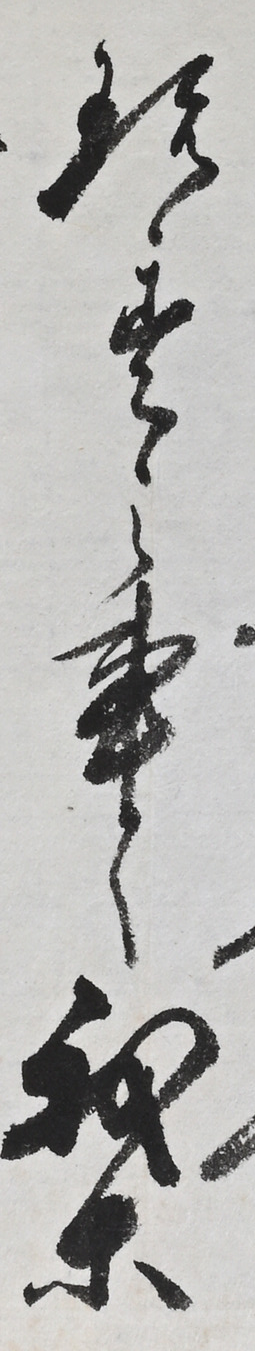珍重之事ニ我等
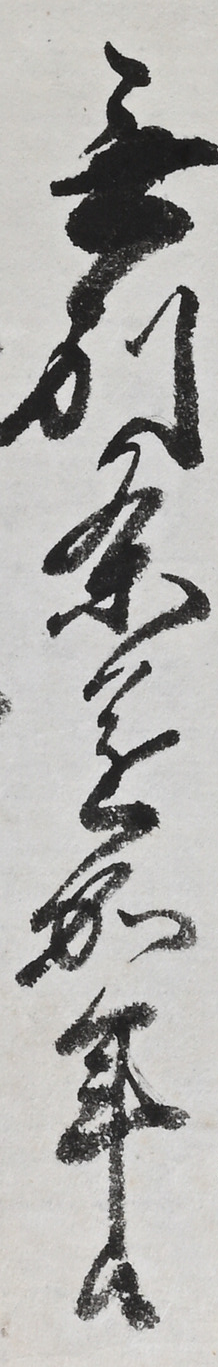無別条遂加年候
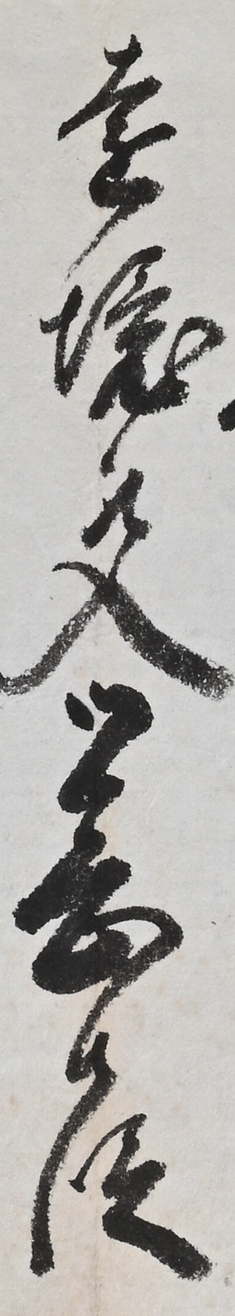遠境被入御念候段
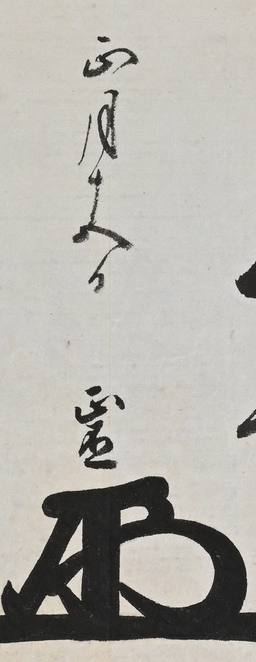正月十五日正丕
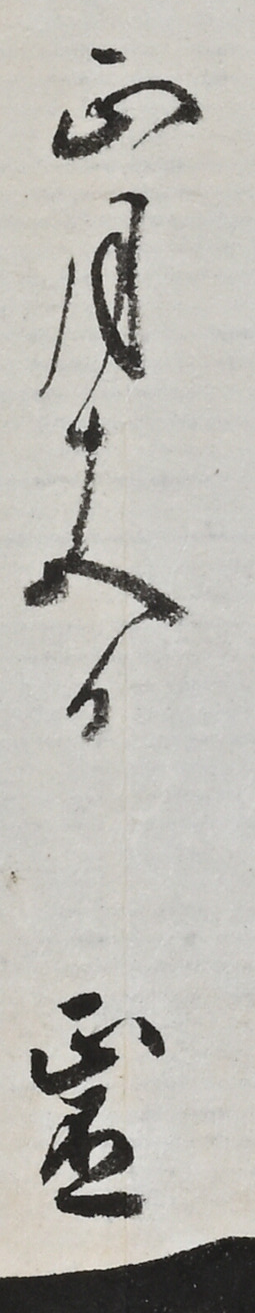正月十五日正丕
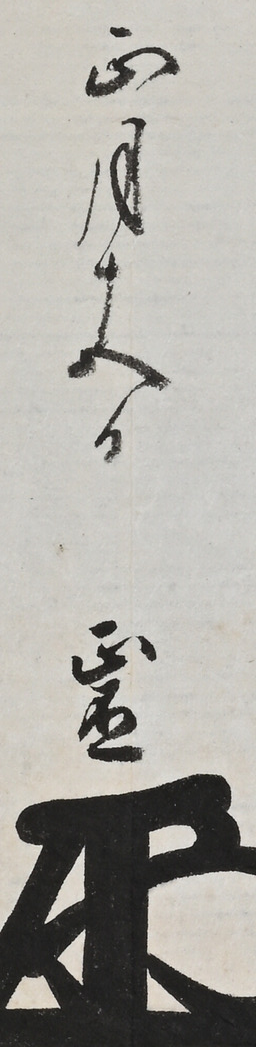正月十五日正丕
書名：書状
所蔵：伊那市立高遠町図書館・合同会社AMANE
